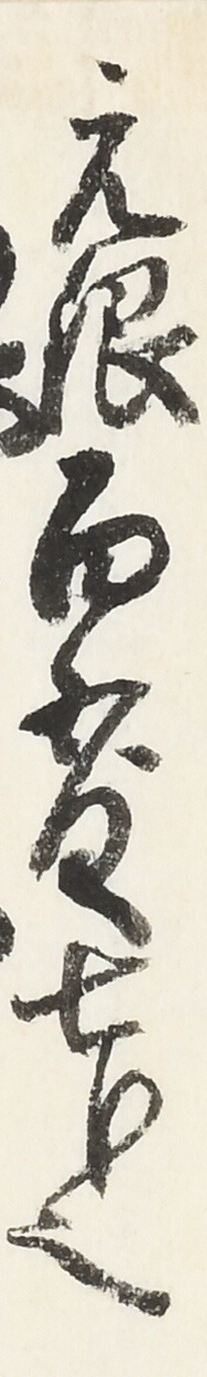元銀百五匁七分也
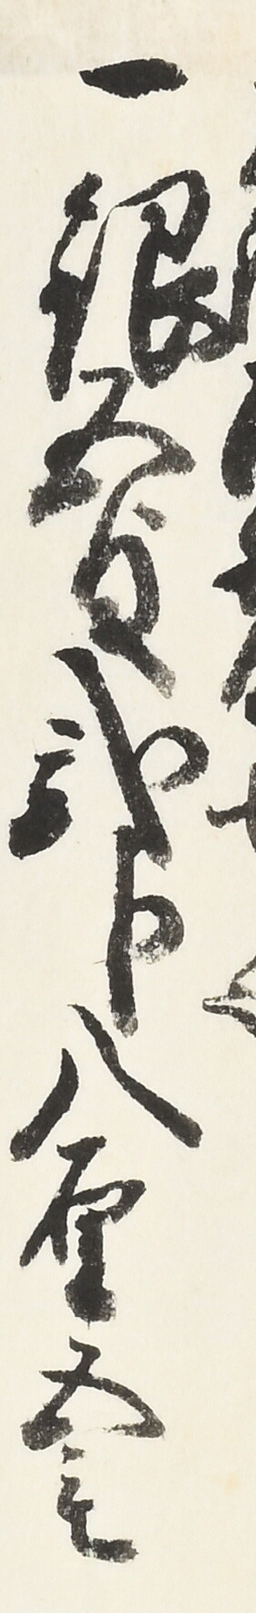一銀五匁弐分八厘五毛
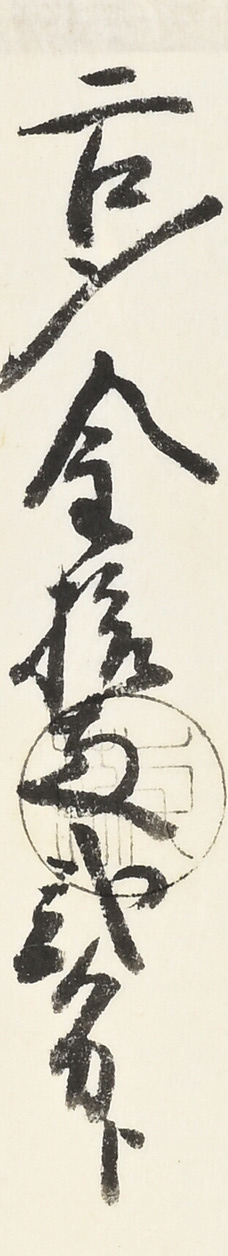二口〆金拾両弐分ト
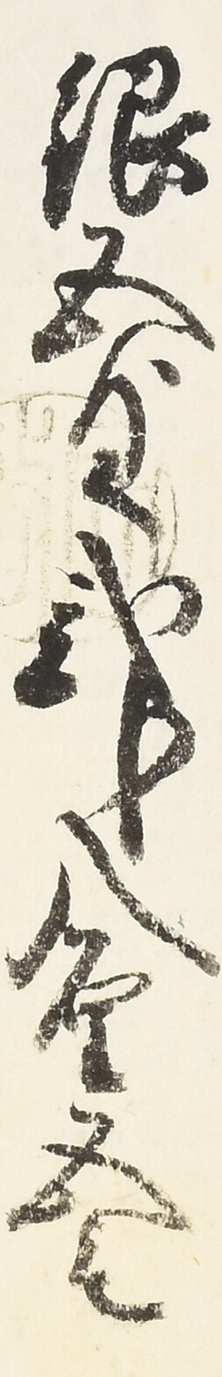銀五匁弐分八厘五毛
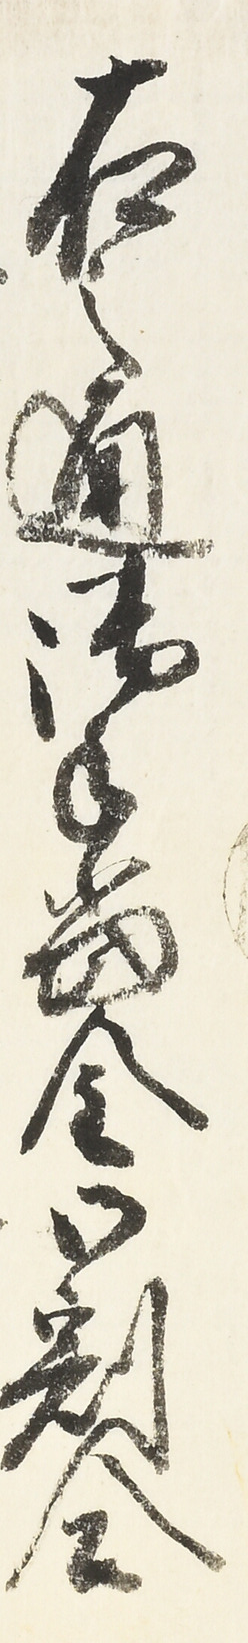右之通御手当金御割合
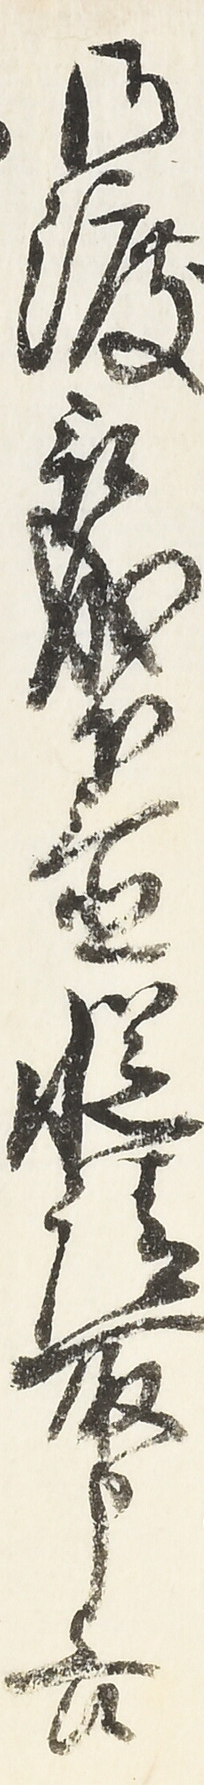御渡被成下置慥請取申上候
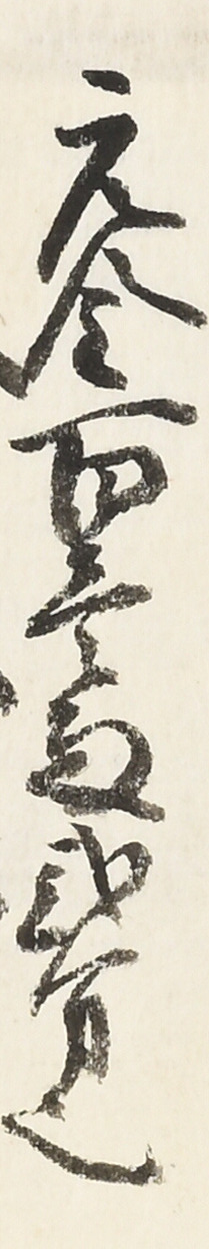元金百壱両弐分也
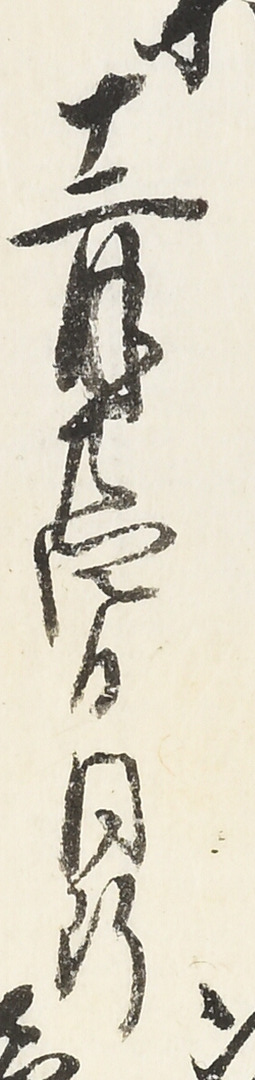十二月廿四日同断
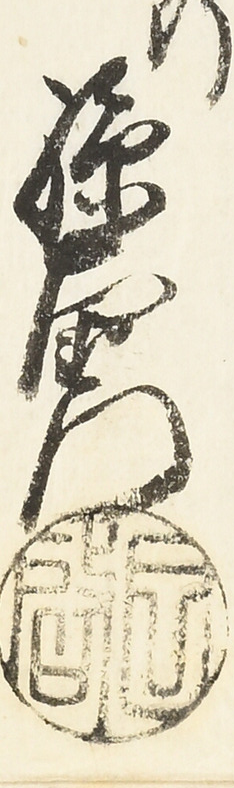孫右衛門
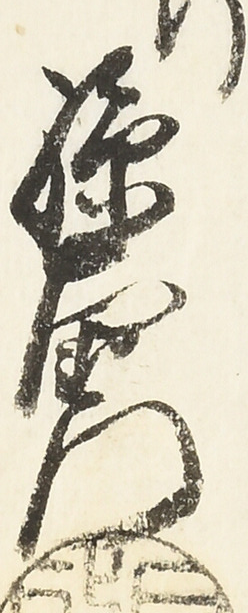孫右衛門
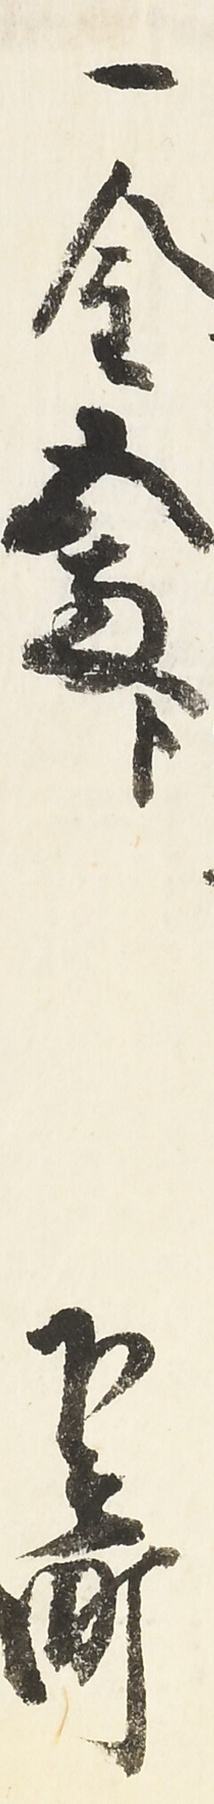一金五両ト下モ町
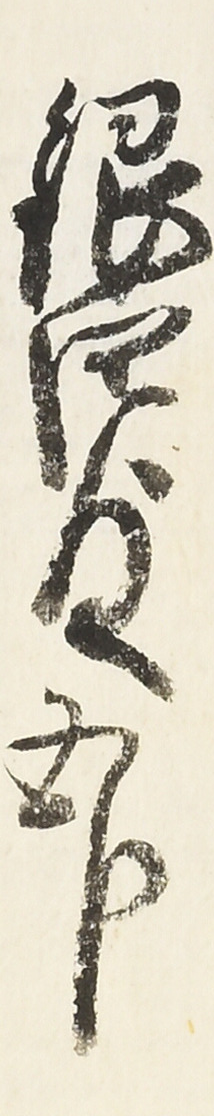銀四匁五分
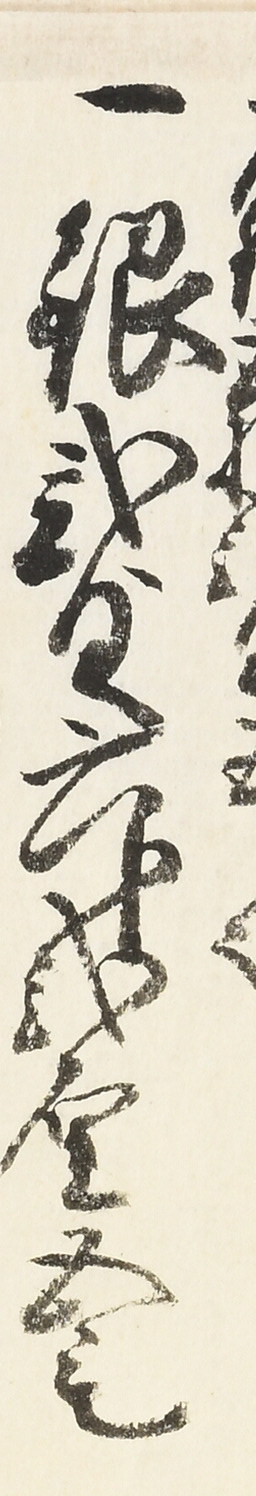一銀弐匁六分弐厘五毛
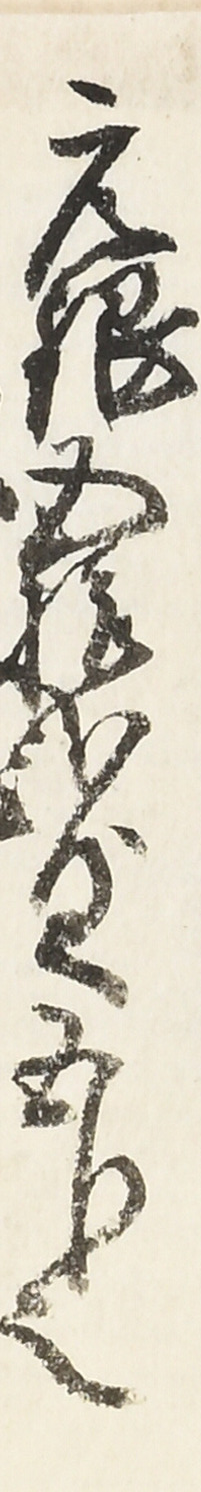元銀五拾弐匁五分也
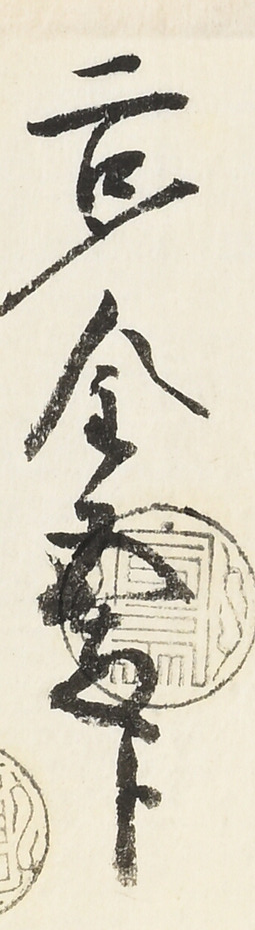二口〆金五両ト
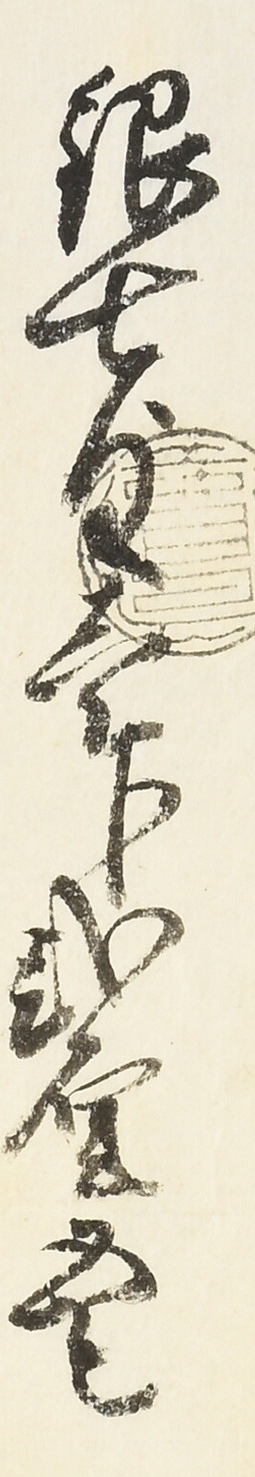銀七匁壱分弐厘五毛
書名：御才覚金御利足割渡扣帳
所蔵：伊那市立高遠町図書館・合同会社AMANE
